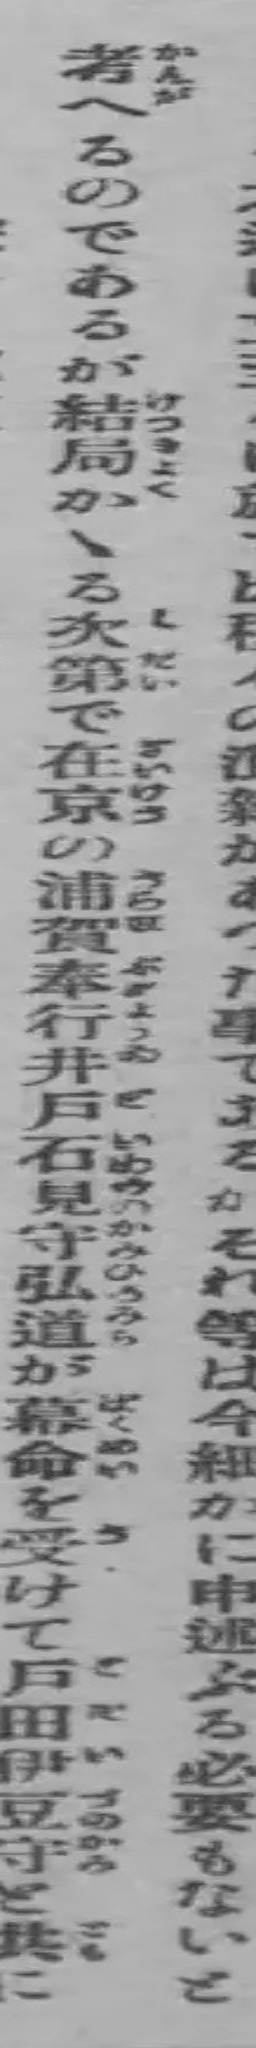考へるのであるが結局かゝる次第で在京の浦賀奉行井戸石見守弘道が幕命を受けて戸田伊豆守と共に
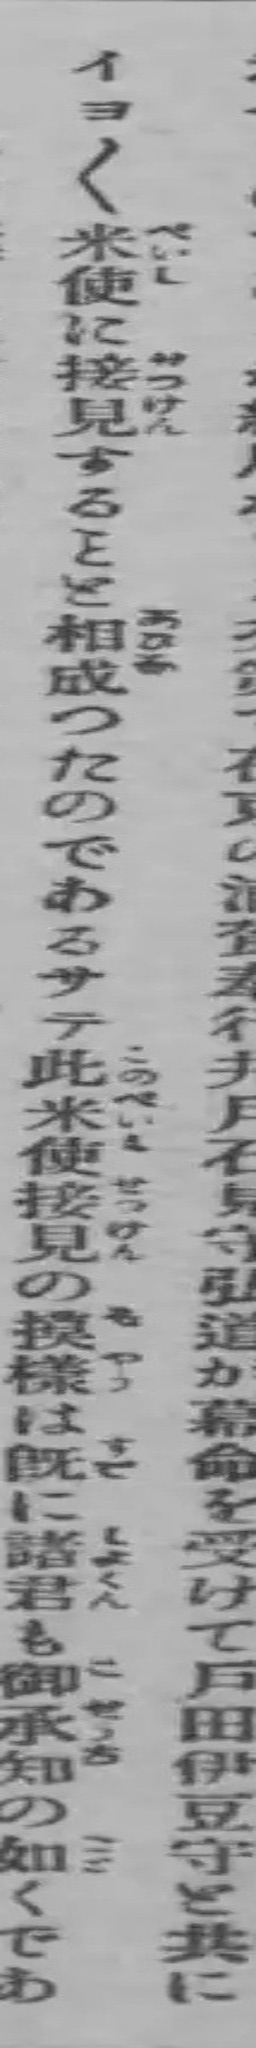イヨ〳〵米使に接見することと相成つたのであるサテ此米使接見の模様は既に諸君も御承知の如くであ
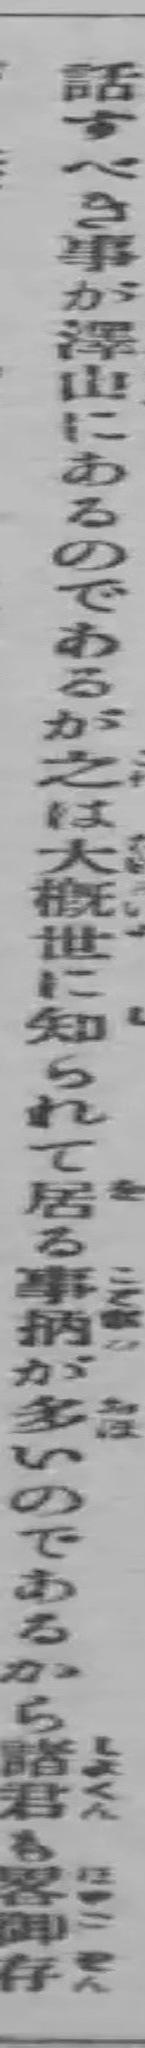話すべき事が沢山にあるのであるが之は大概世に知られて居る事柄が多いのであるから諸君も略御存
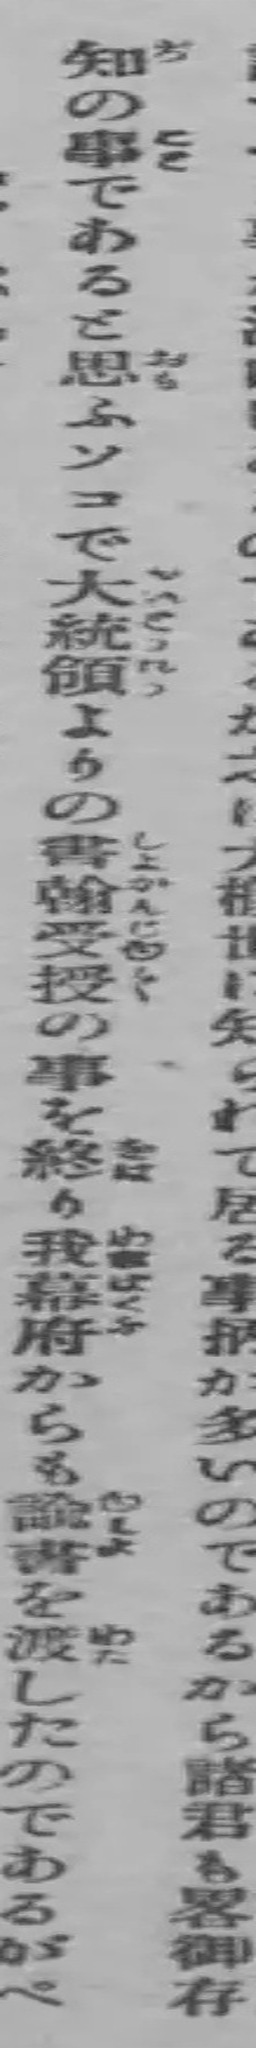知の事であると思ふソコで大統領よりの書翰授受の事を終り我幕府からも諭書を渡したのであるがペ
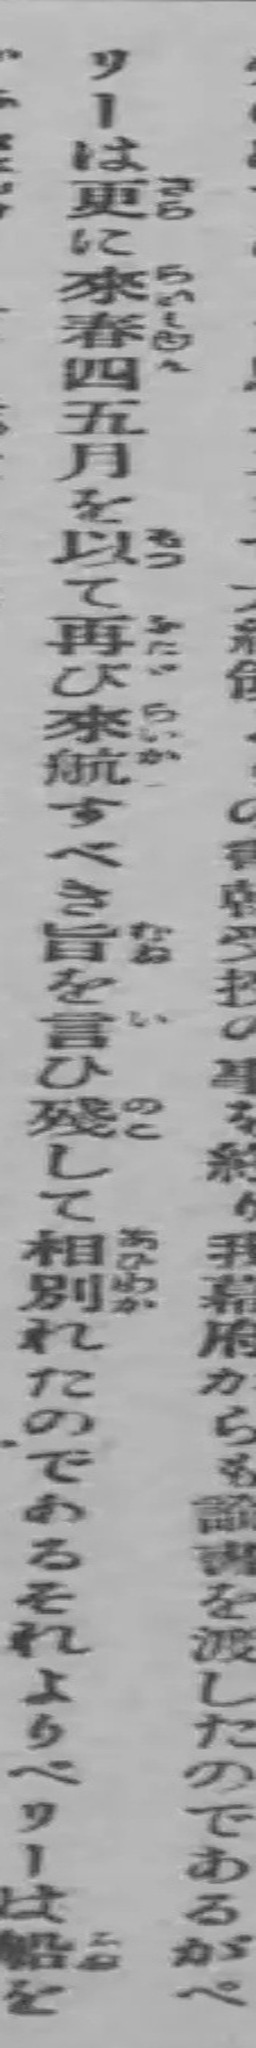リーは更に来春四五月を以て再び来航すべき旨を言ひ残して相別れたのであるそれよりペリーは船を
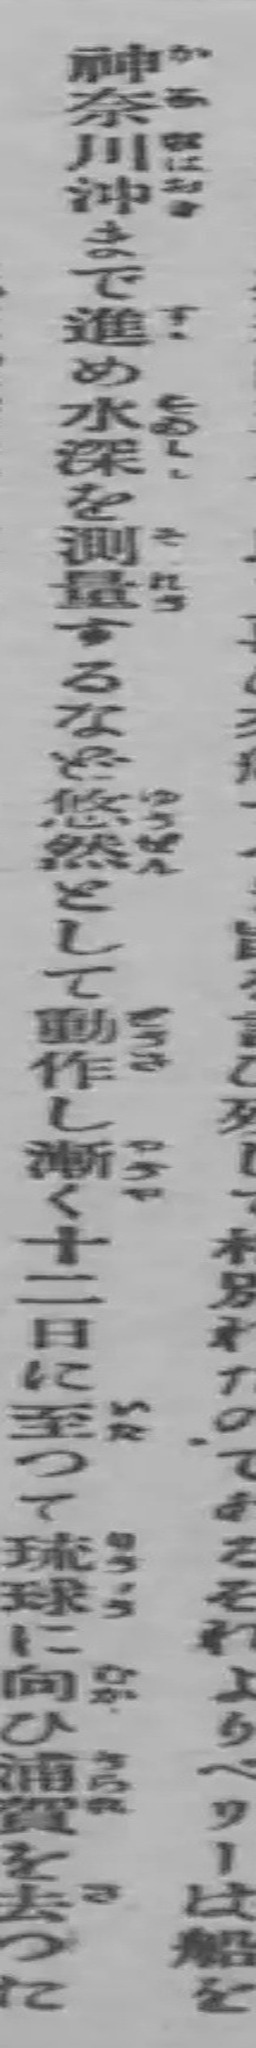神奈川沖まで進め水深を測量するなど悠然として動作し漸く十二日に到つて琉球に向ひ浦賀を去つた
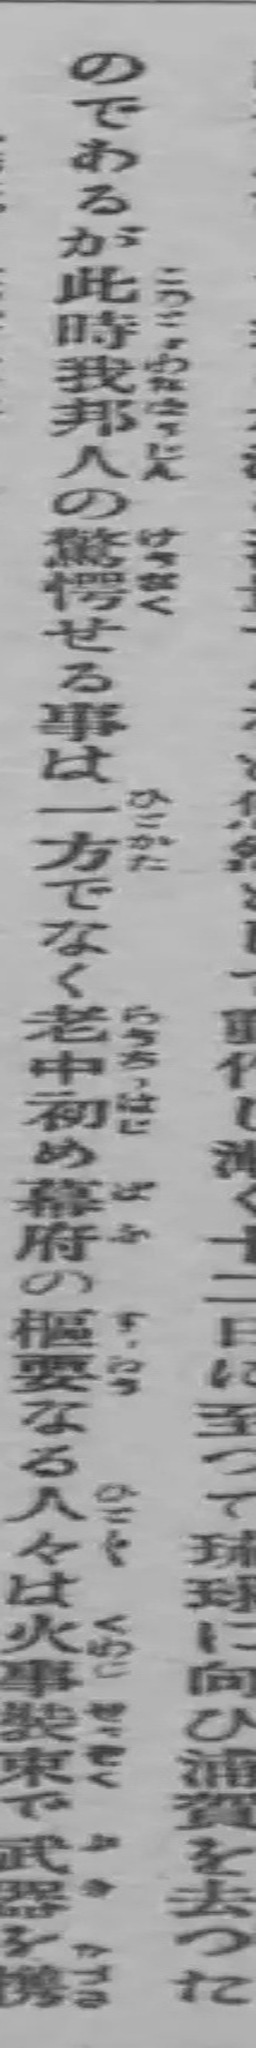のであるが此時我邦人の驚愕せる事は一方でなく老中初め幕府の枢要なる人々は火事装束で武器を携
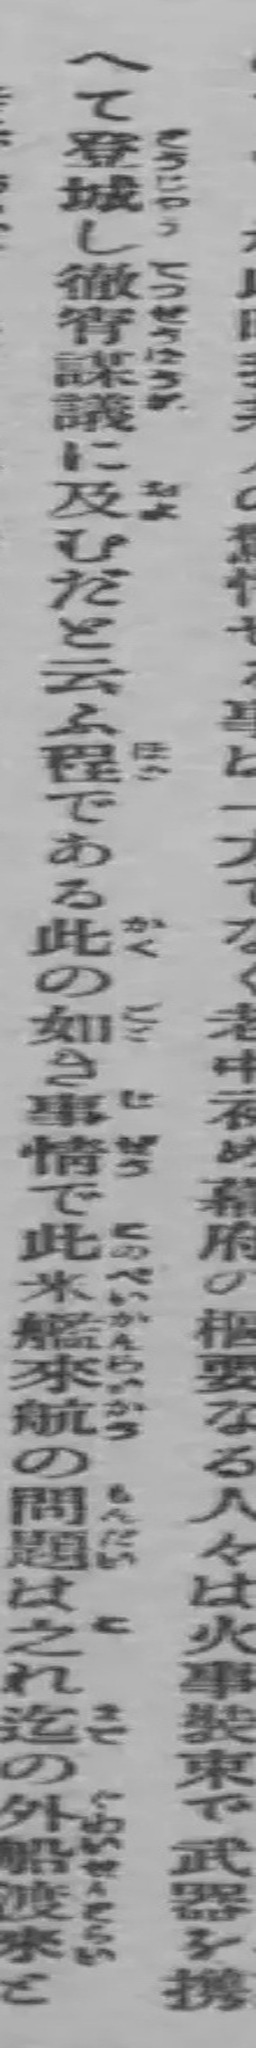へて登城し徹宵謀議に及むだと云ふ程である此の如き事情で此米艦来航の問題は之れ迄の外船渡来と
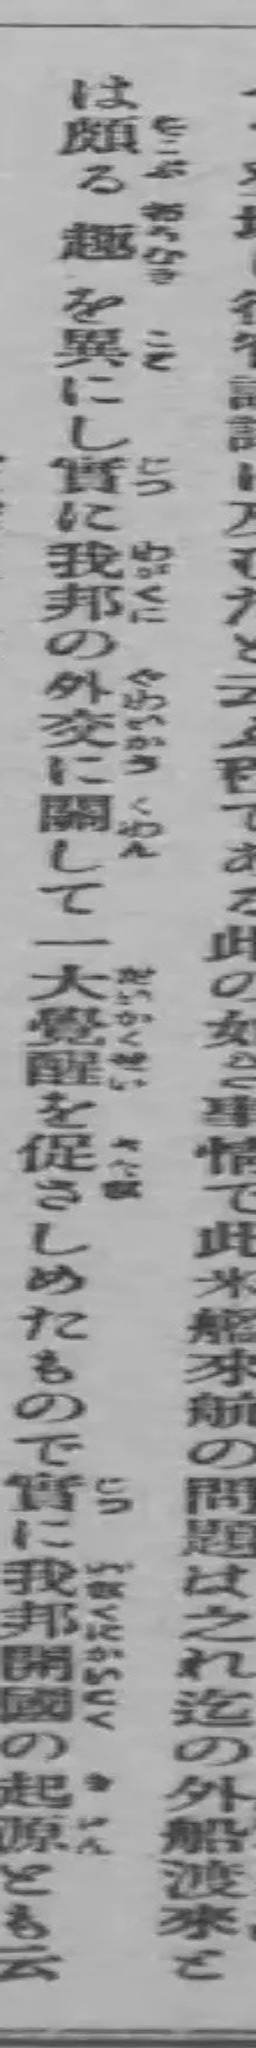は頗る趣を異にし実に我邦の外交に関して一大覚醒を促さしめたもので実に我邦開国の起源とも云
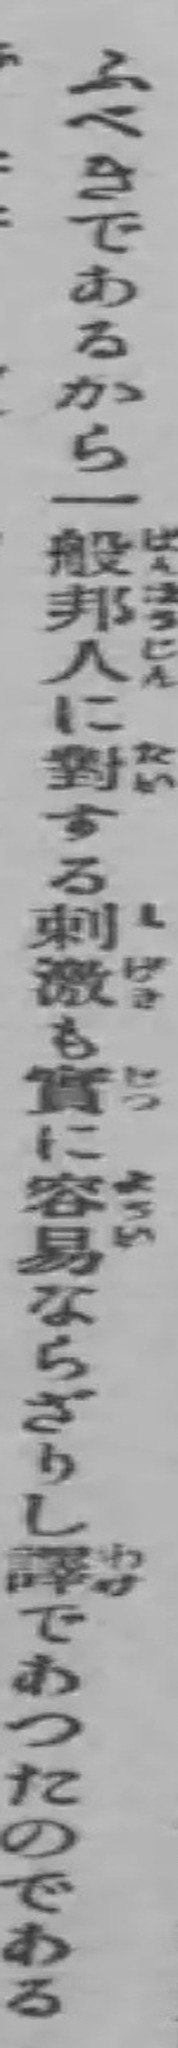ふべきであるから一般邦人に対する刺激も実に容易ならざりし訳であつたのである
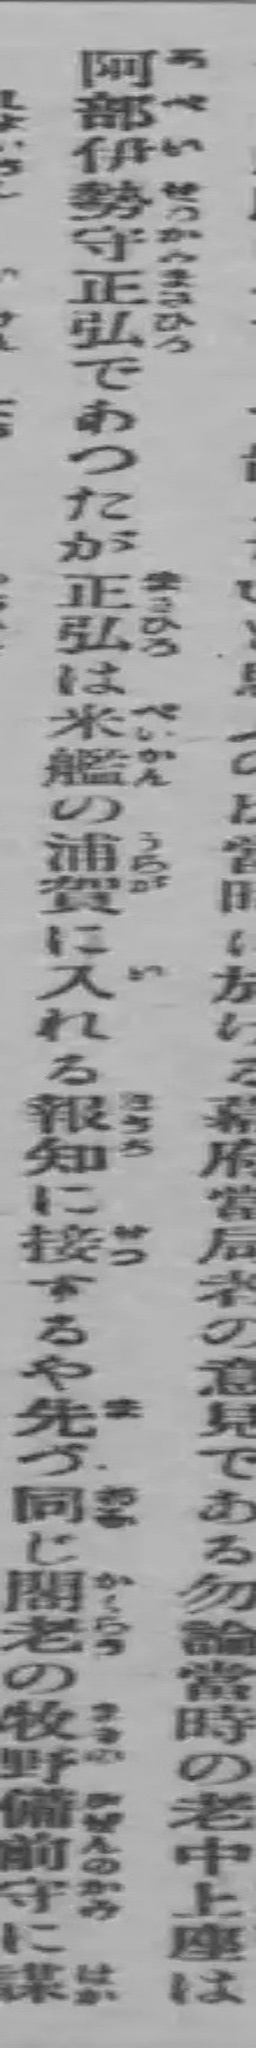阿部伊勢守正弘であつたが正弘は米艦の浦賀に入れる報知に接するや先づ同じ閣老の牧野備前守に謀
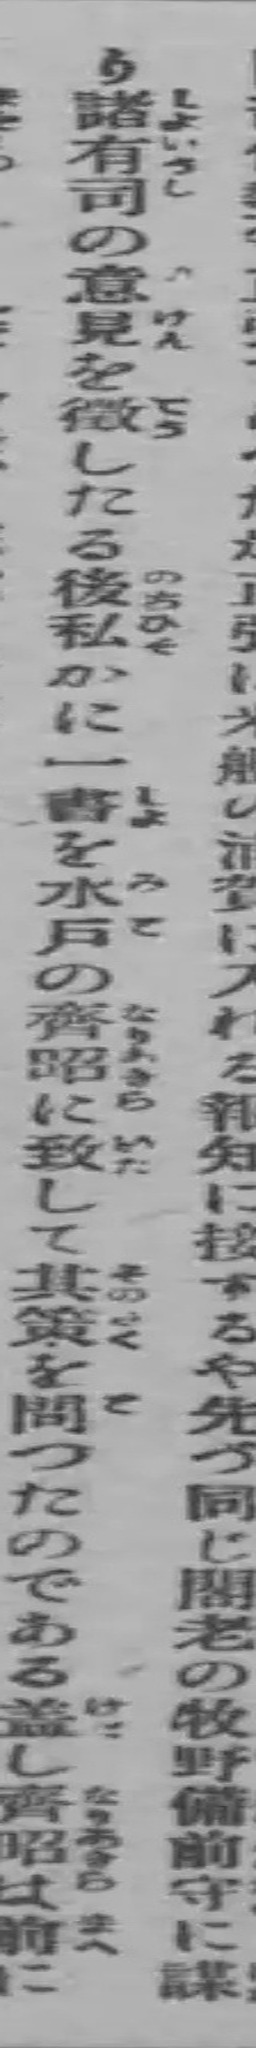り諸有司の意見を徴したる後私かに一書を水戸の斉昭に致して其策を問つたのである蓋し斉昭は前に
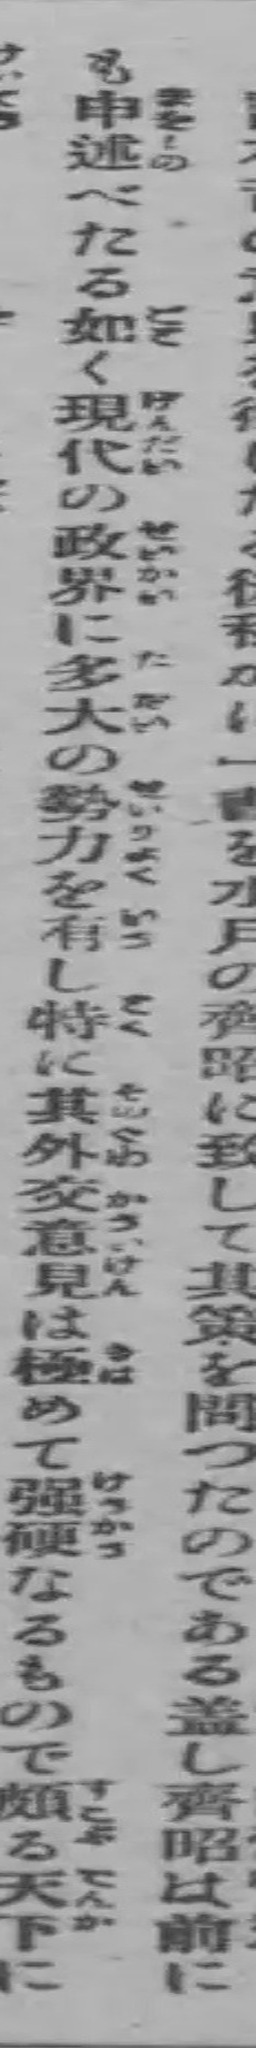も申述べたる如く現代の政界に多大の勢力を有し特に其外交意見は極めて強硬なるもので頗る天下に
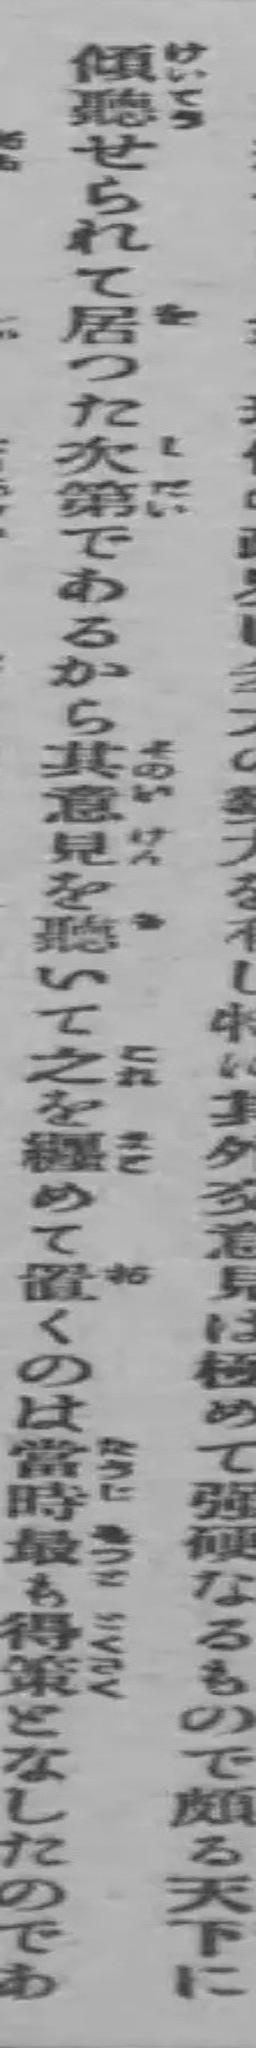傾聴せられて居つた次第であるから其意見を聴いて之を纏めて置くのは当時最も得策となしたのであ
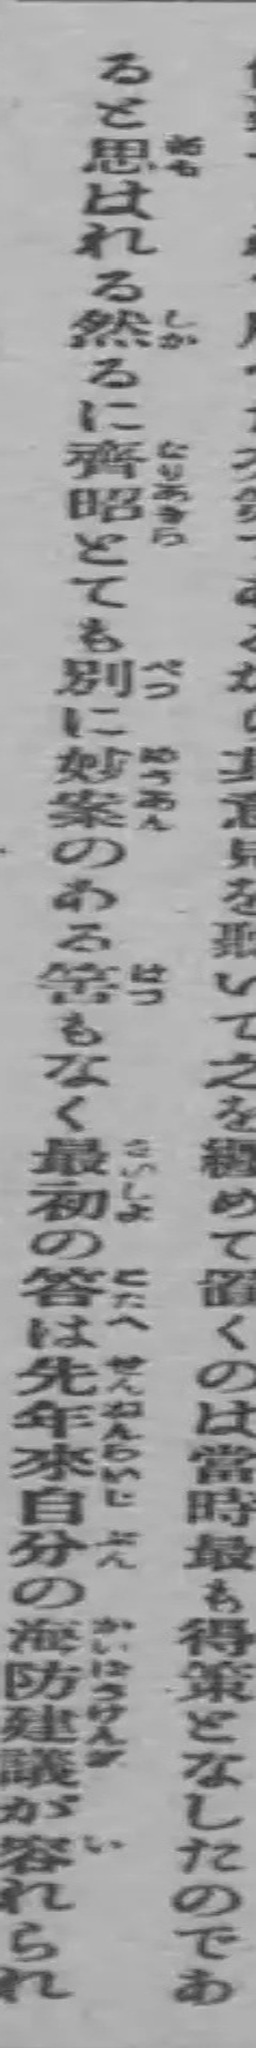ると思はれる然るに斉昭とても別に妙案のある筈もなく最初の答は先年来自分の海防建議が容れられ
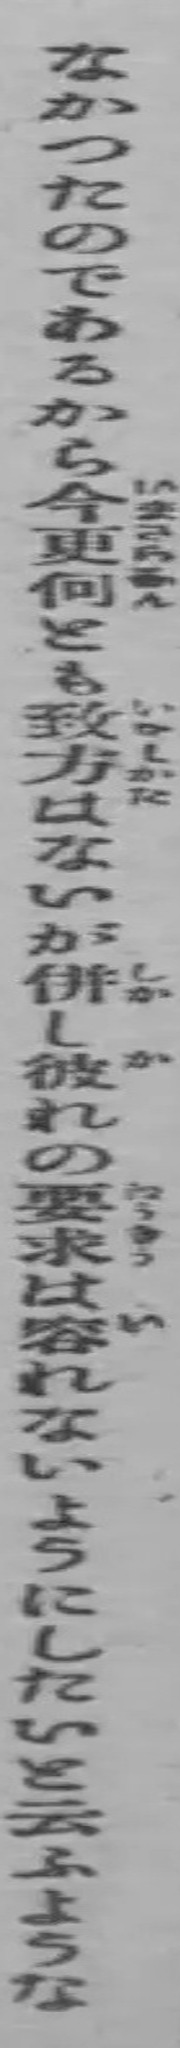なかつたのであるから今更何とも致方はないが併し彼れの要求は容れないようにしたいと云ふような
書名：豊橋市史談
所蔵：国立国会図書館 National Diet Library, JAPAN
